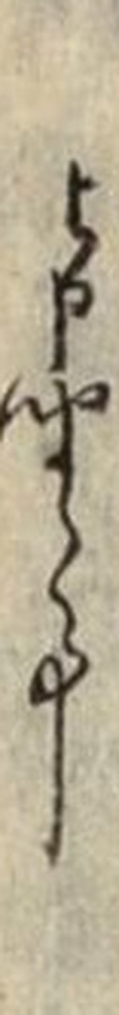被申聞候事
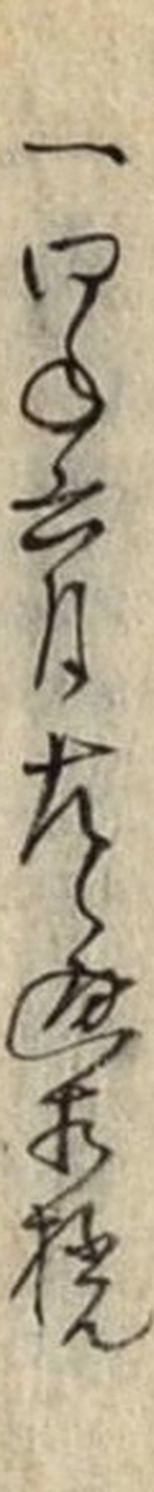一同年六月左之通相極る
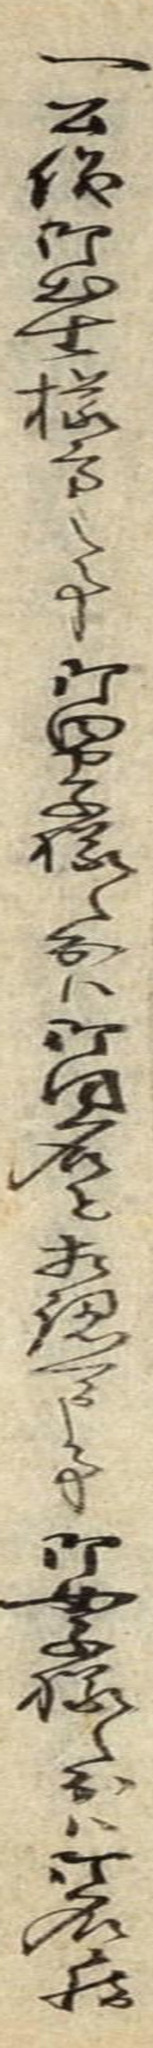一公儀御出生様方之事御男子様之分は御同名と相認可申候事御女子様之分は御名指
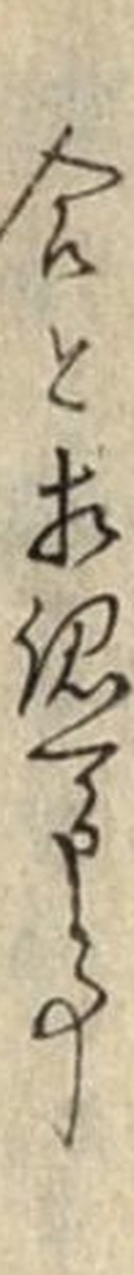合と相認可申事
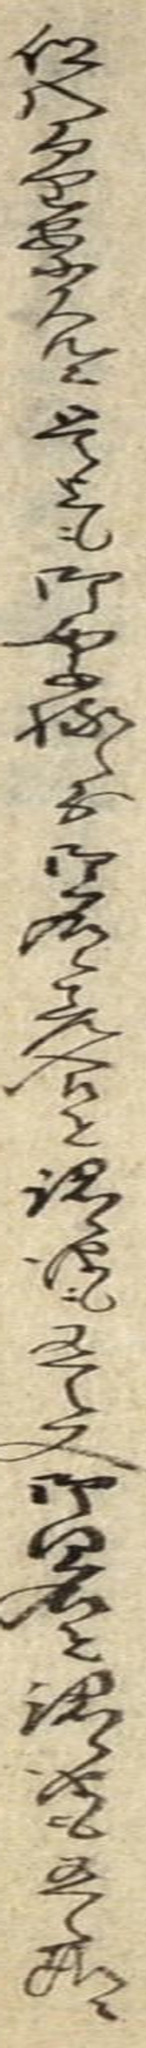但八百里案するに是迄も御女子様之分御名差合と認候儀も有之又御同名と認候儀も有之趣に
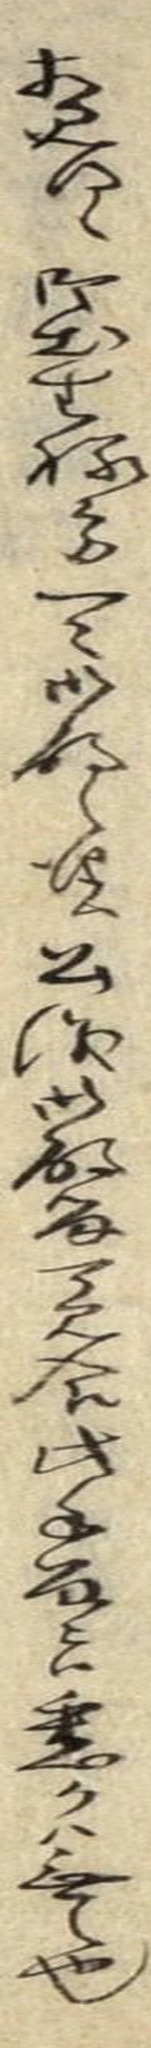相見得候御出生様方一々御触之儀は公儀御触留可見合此年留には悉くは無之也
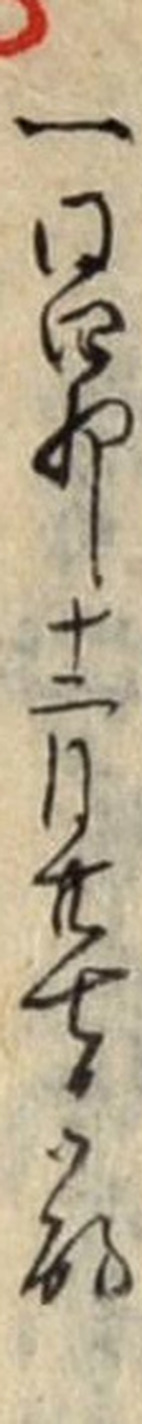一同四卯十二月廿七日御触

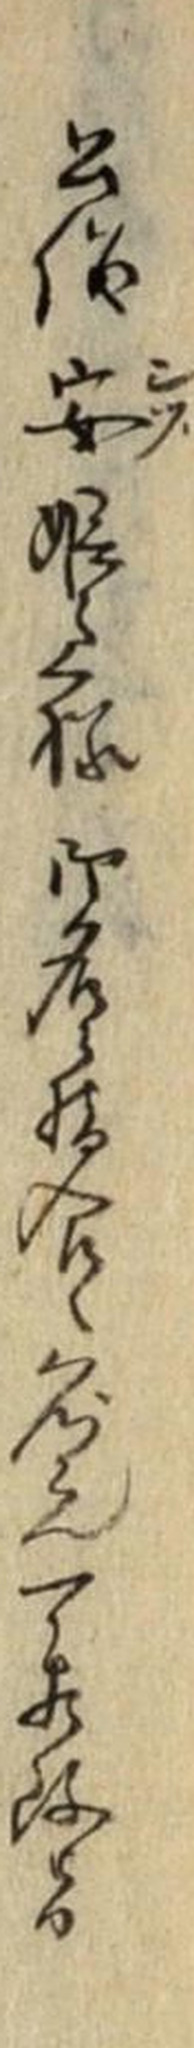公儀安姫君様御名に指合候名元可相改旨
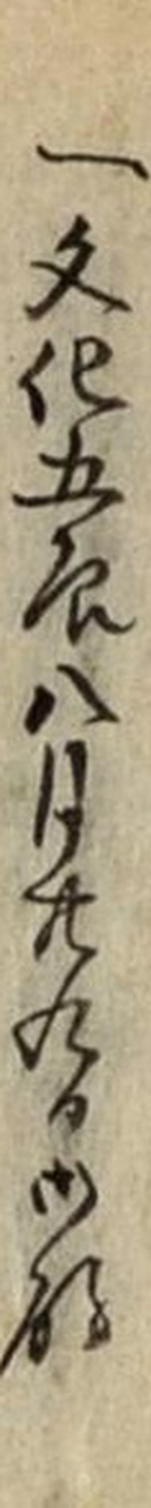一文化五辰八月廿九日御触
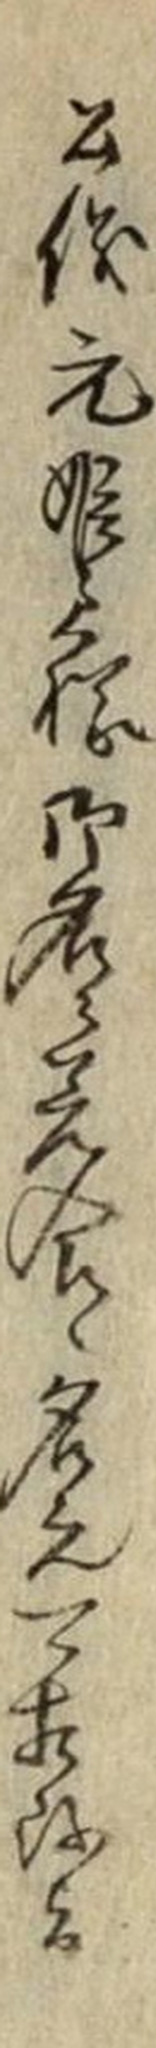公儀元姫君様御名に差合候名元可相改旨
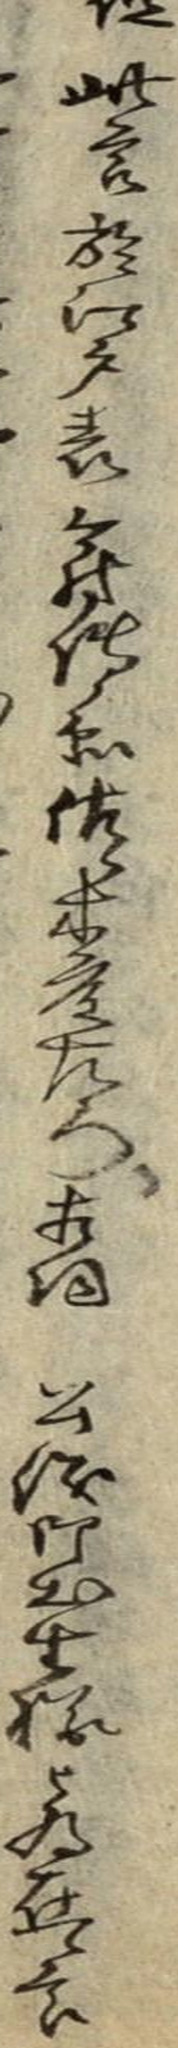但此節於江戸表今村伝兵衛佐々木藤左衛門相伺公儀御出生様被為在候節
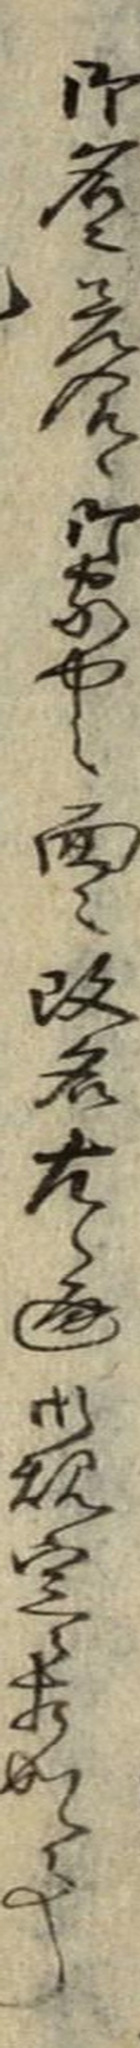御名に差合候御家中之面々改名左之通御規定に相成候事
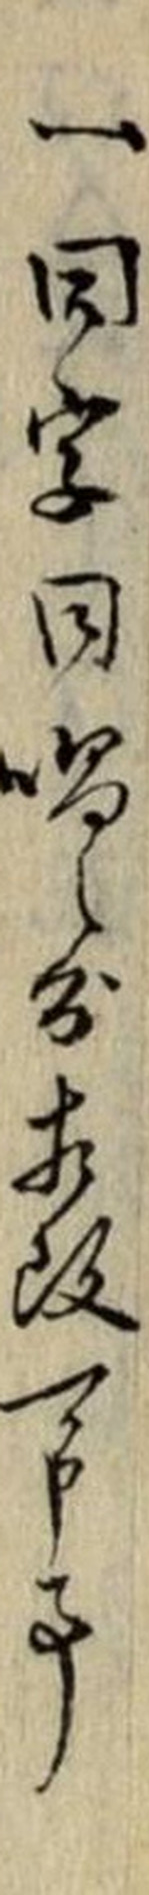一同字同唱之分相改可申事
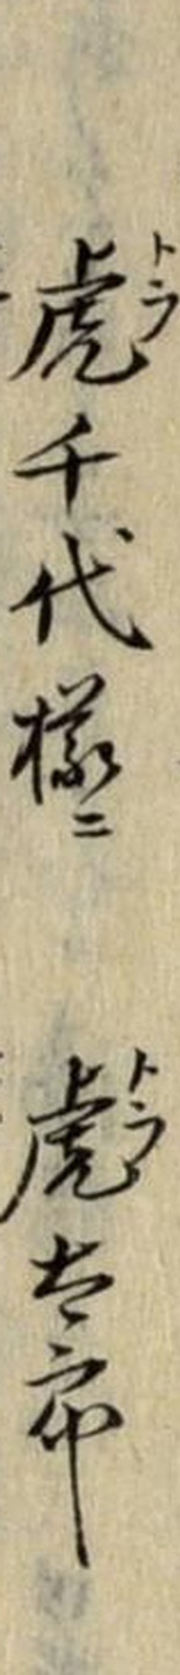註虎千代様に虎太郎
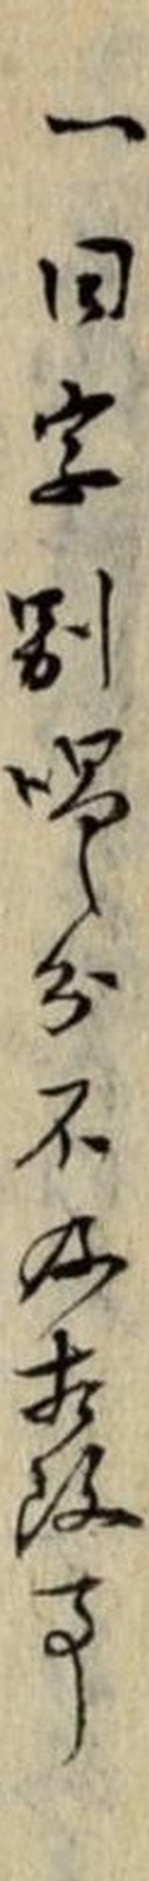一同字別唱之分不及相改事
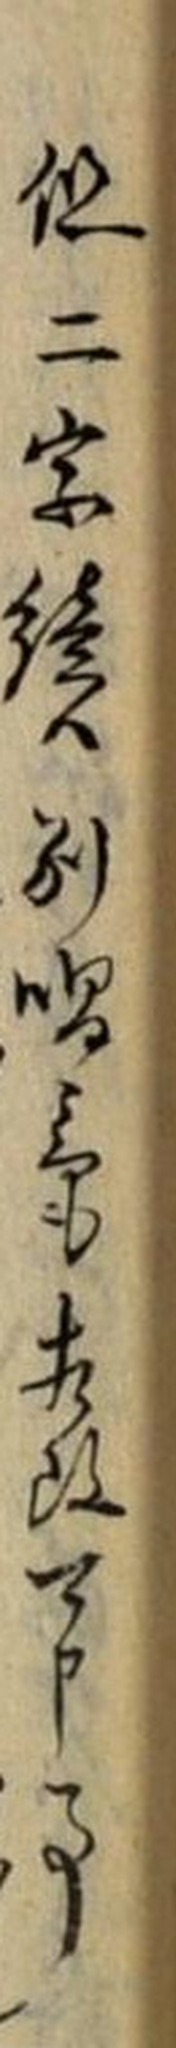但二字続は別唱に而も相改可申事
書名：蒐輯之部
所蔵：福井県文書館 Fukui Prefectural Archives
